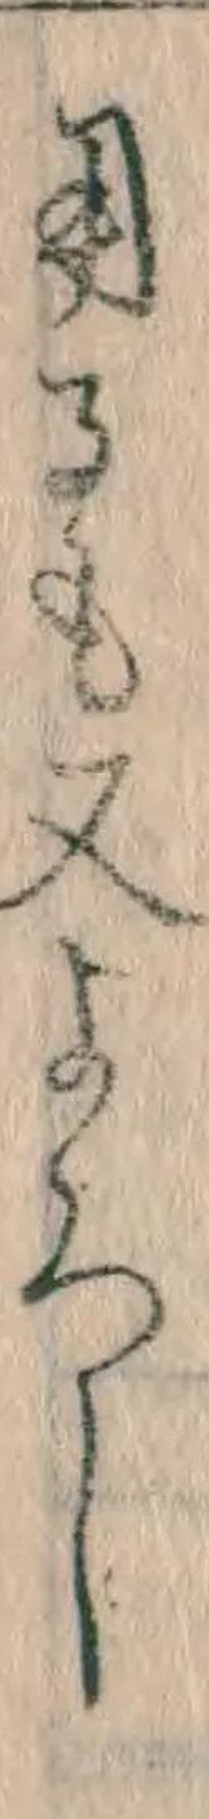用るも又よろし
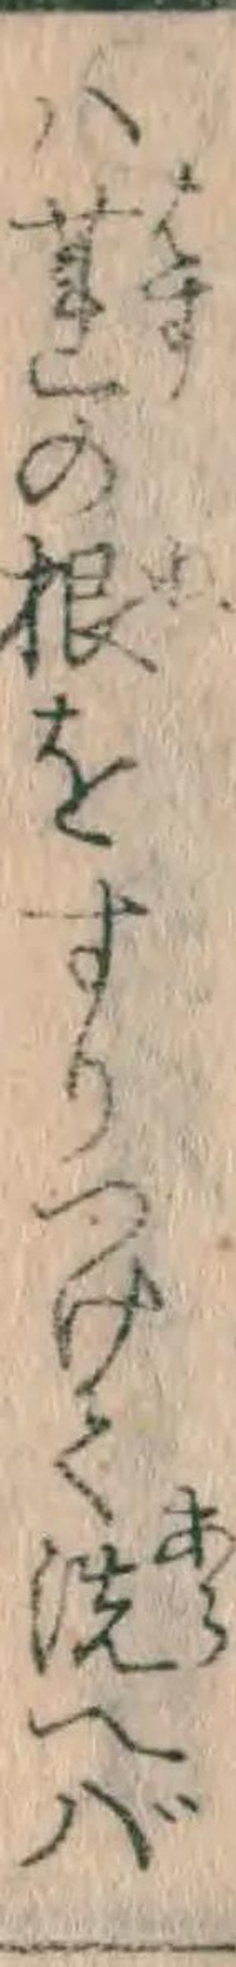は蓮の根をすりつけて洗へば
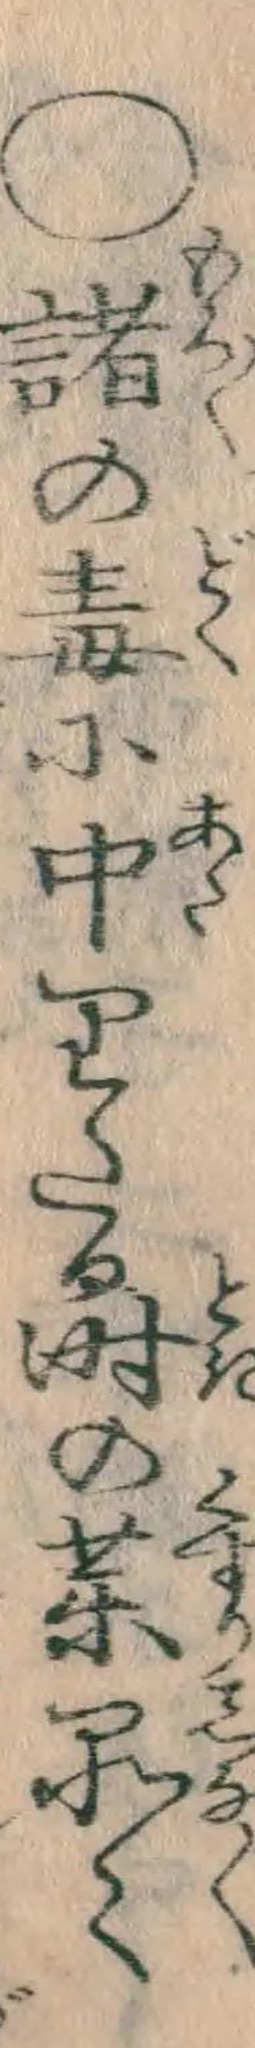○諸の毒に中りたる時の薬品々
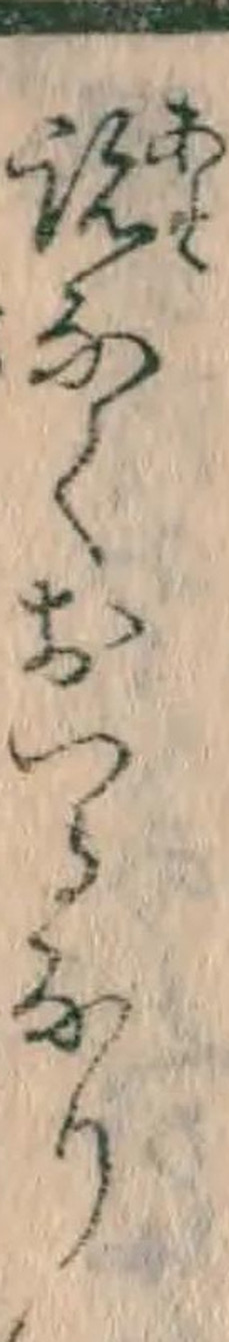跡なくおつるなり
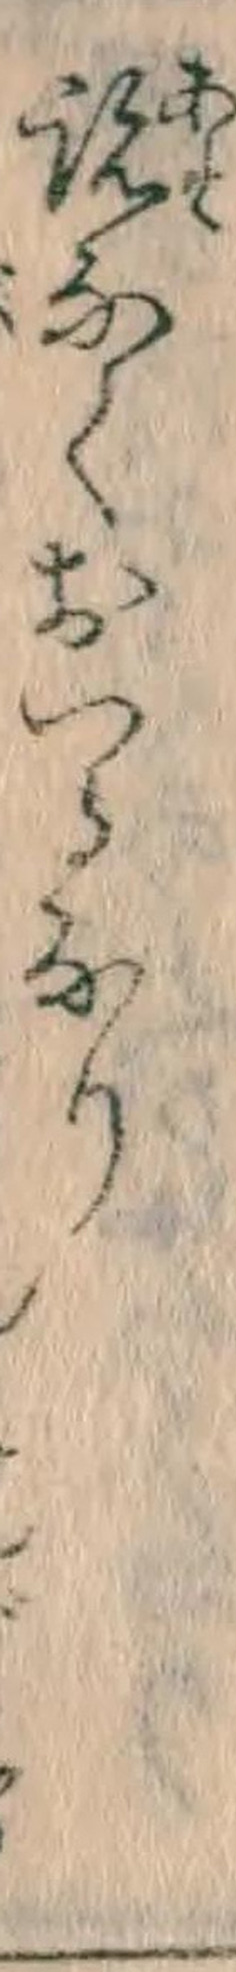跡なくおつるなり
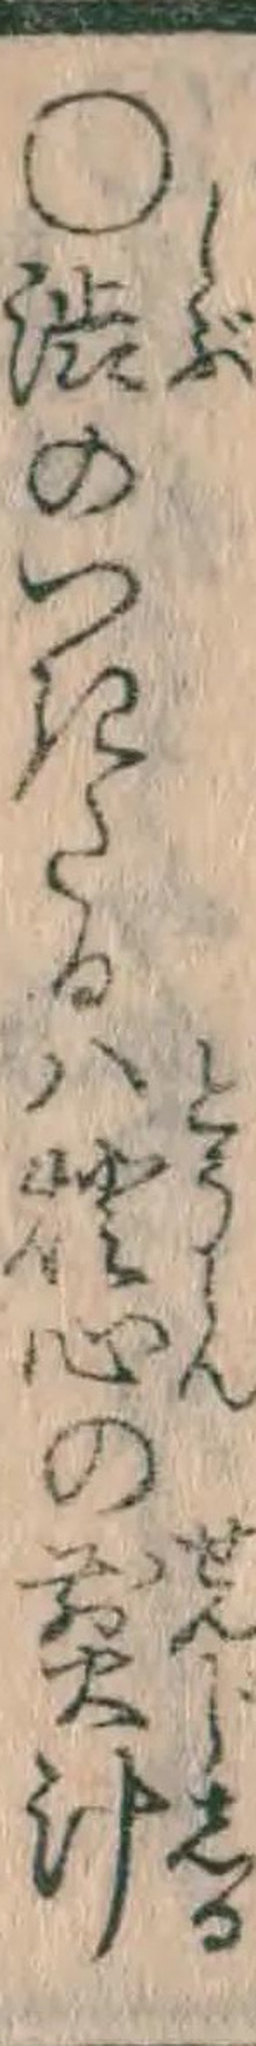○渋のつきたるは燈心の煎汁
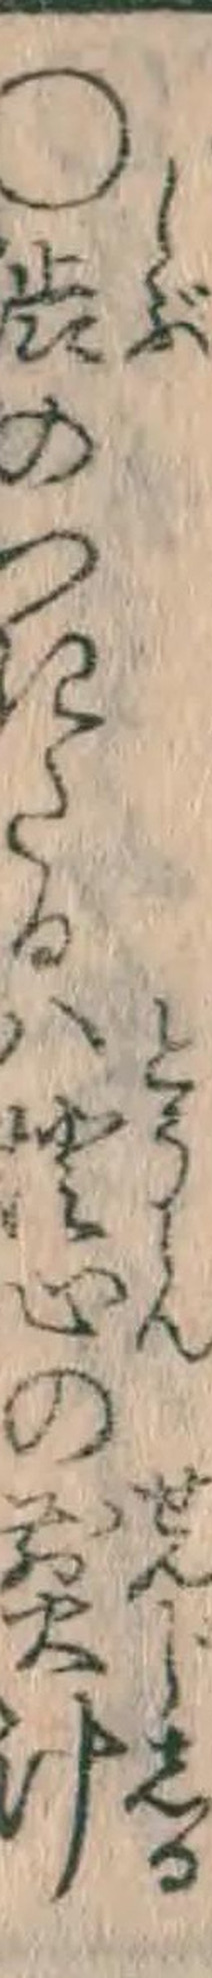○渋のつきたるは燈心の煎汁
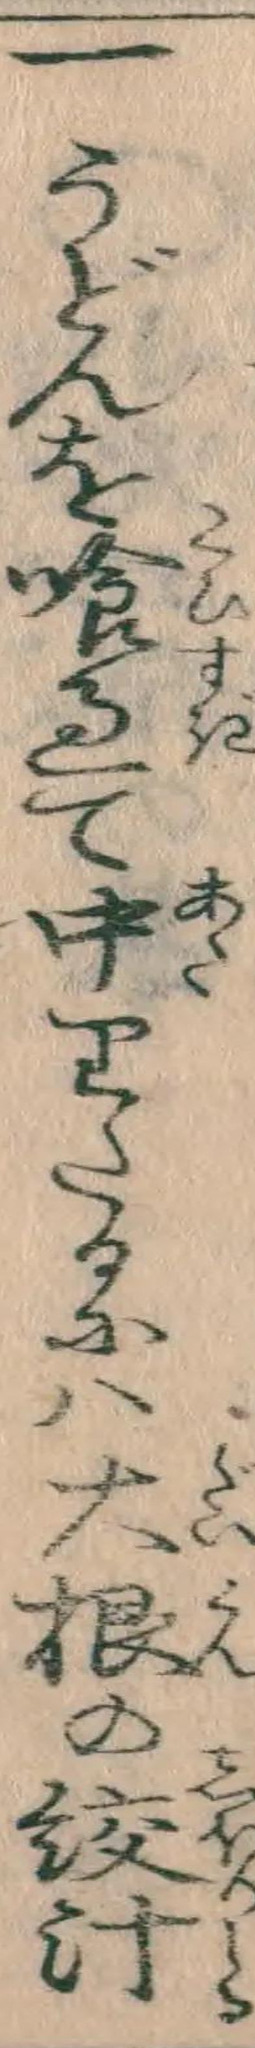一うどんを喰過て中りたるには大根の絞汁
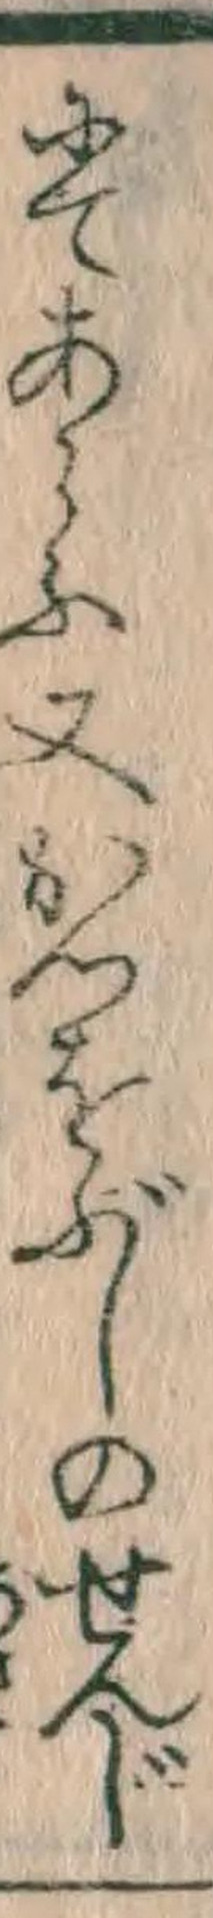にてあらふ又かつをぶしのせんじ
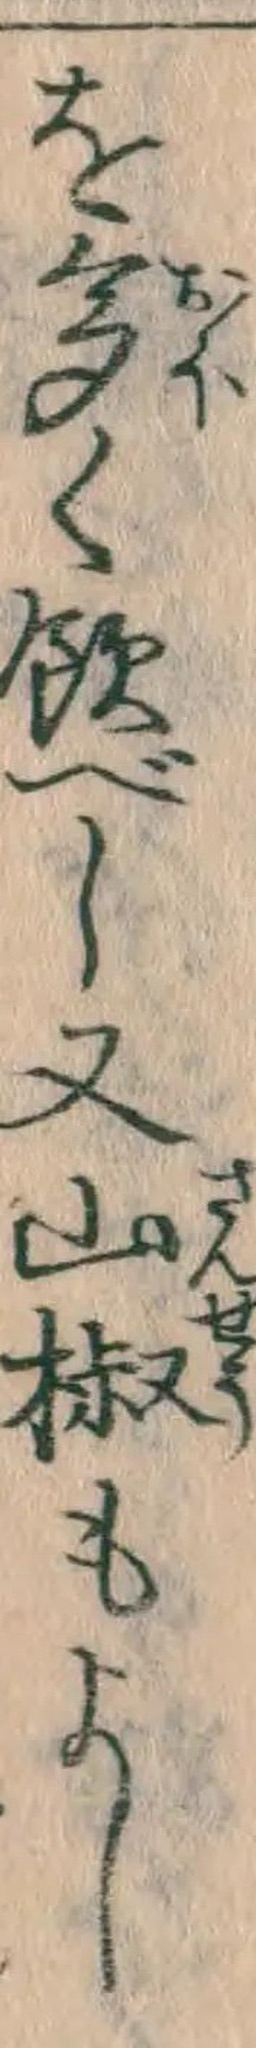を多く飲べし又山椒もよし
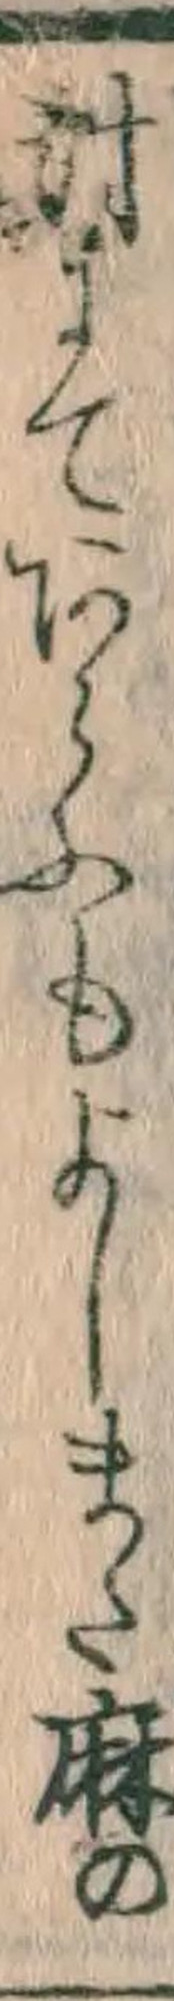汁にてあらふもよしまた麻の
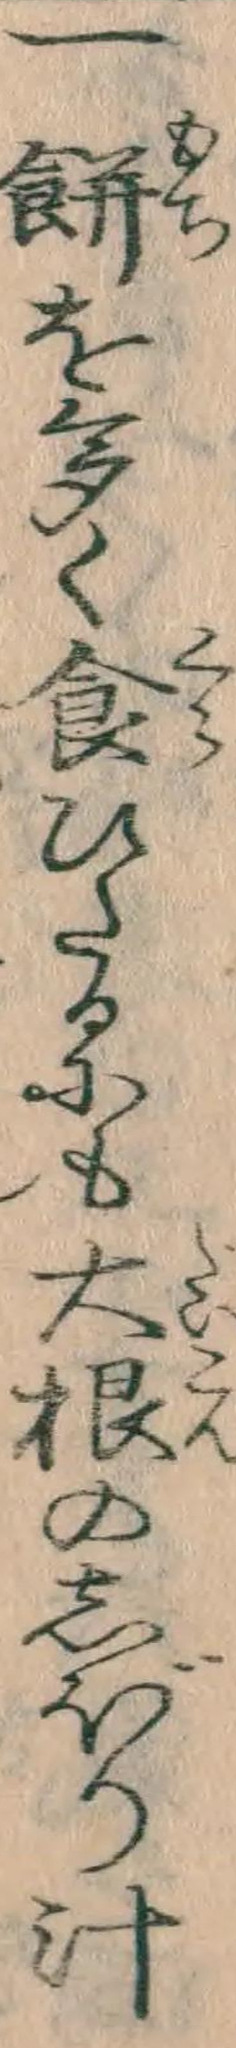一餅を多く食ひたるにも大根のしぼり汁
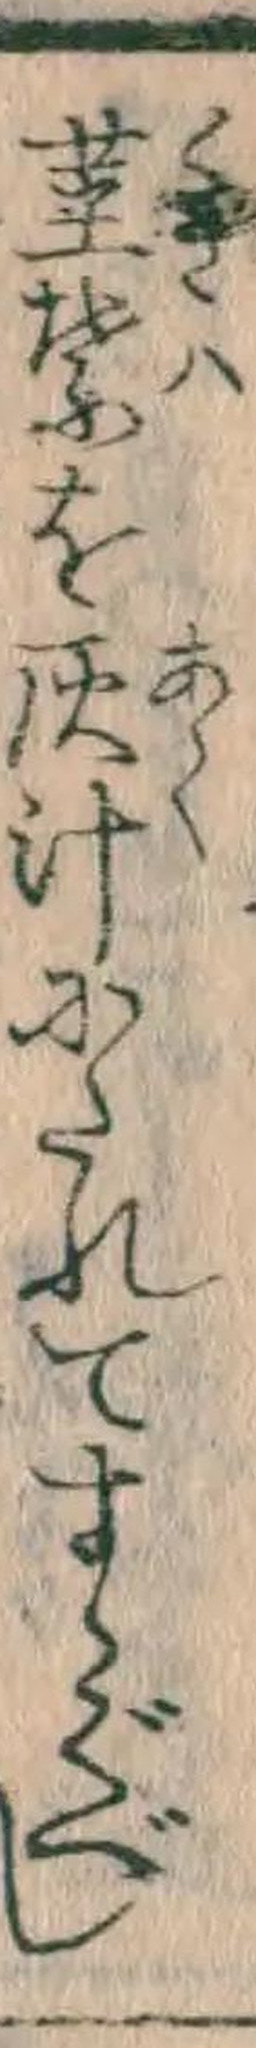茎葉を灰汁にたれてすゝぐべし
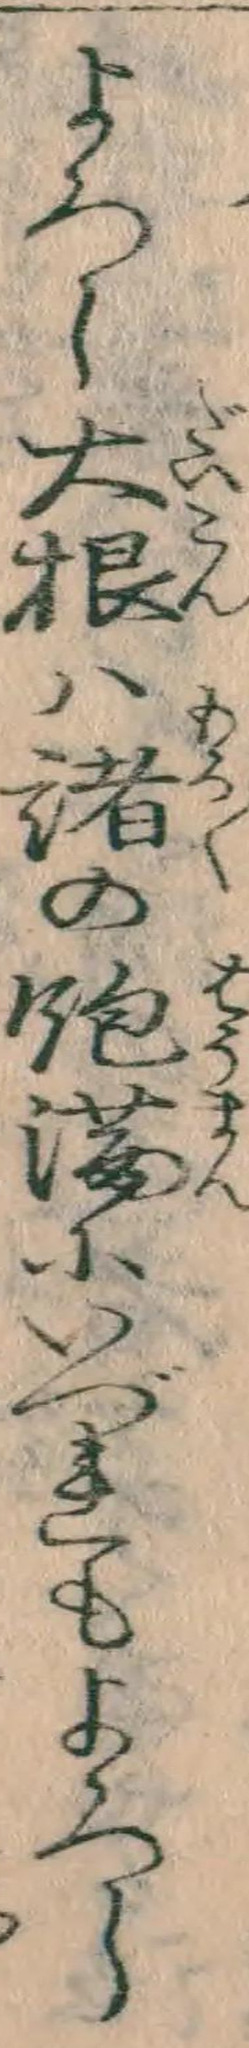よろし大根は諸の飽満にいづれもよろし
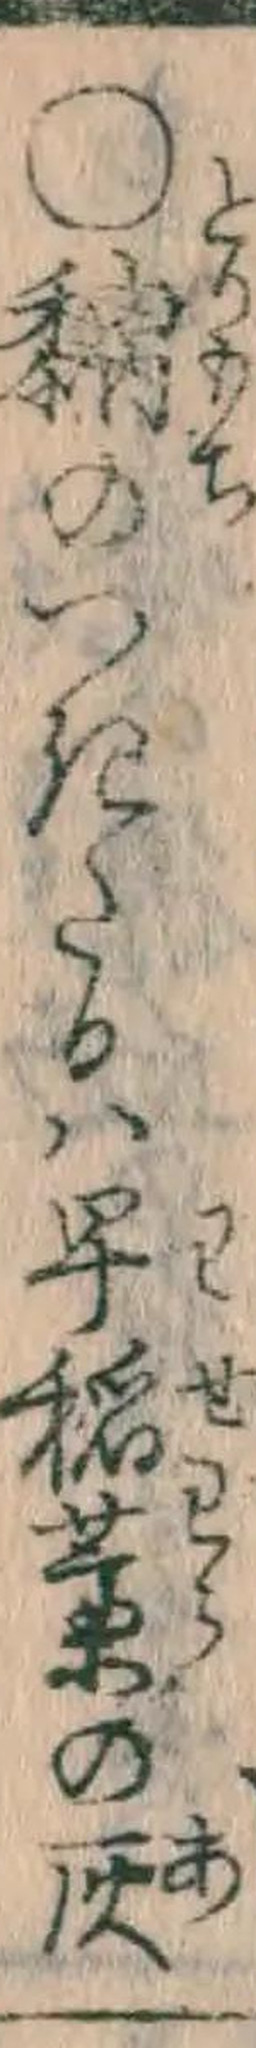○黐のつきたるは早稲藁の灰
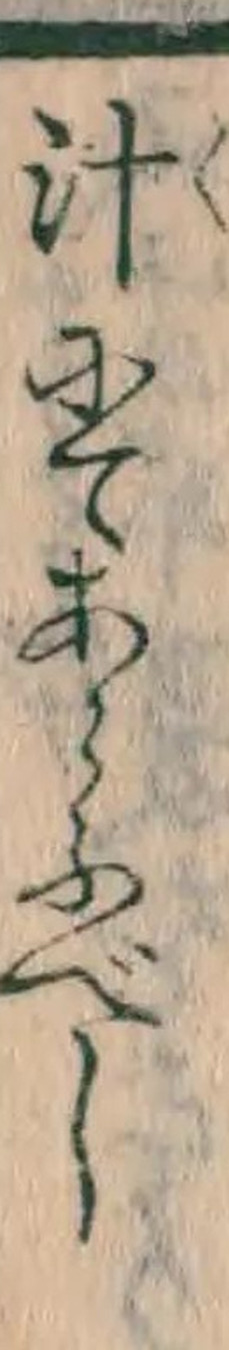汁にてあらふべし
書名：広益秘事大全 3巻. [3]
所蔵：国立国会図書館 National Diet Library, JAPAN
